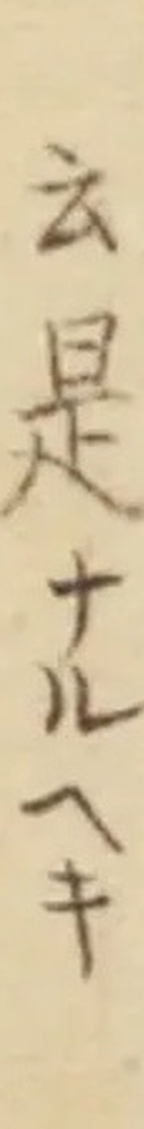云是ナルヘキ

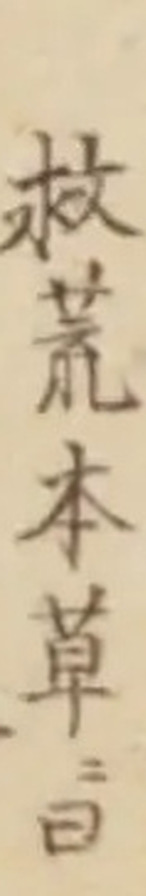救荒本草曰
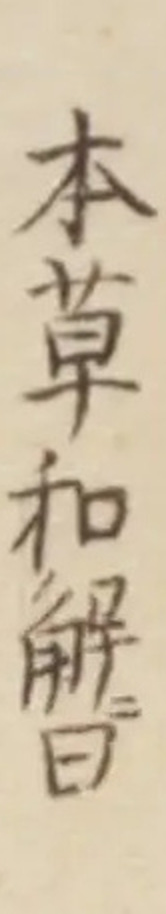本草和解
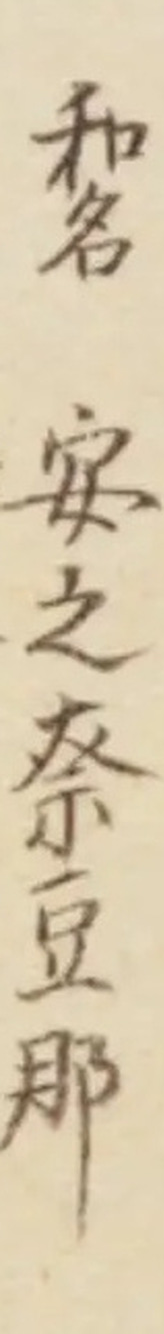和名安之奈豆那
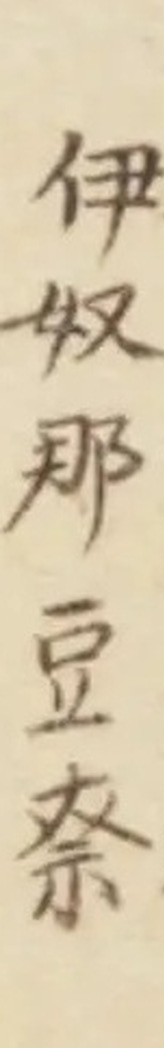伊奴那豆奈
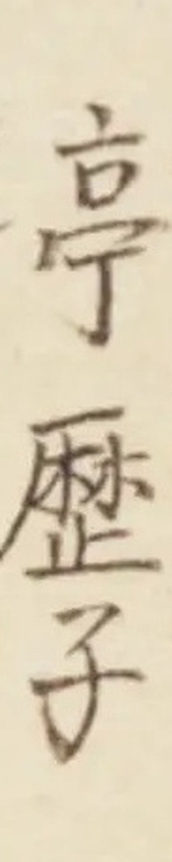亭歴子
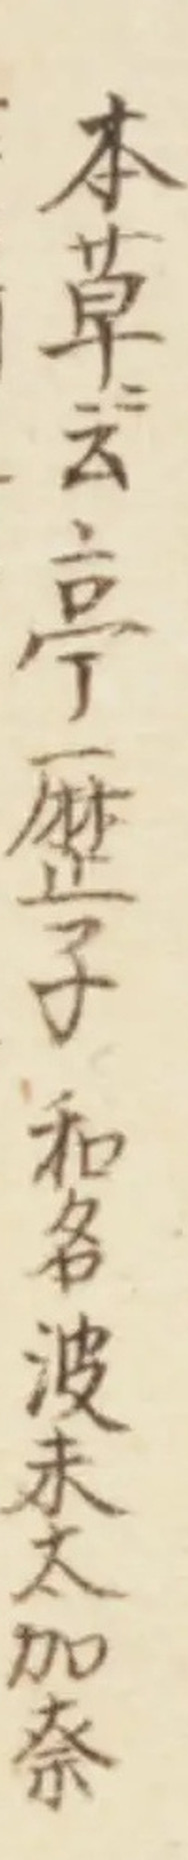本草云亭歴子和名波未太加奈
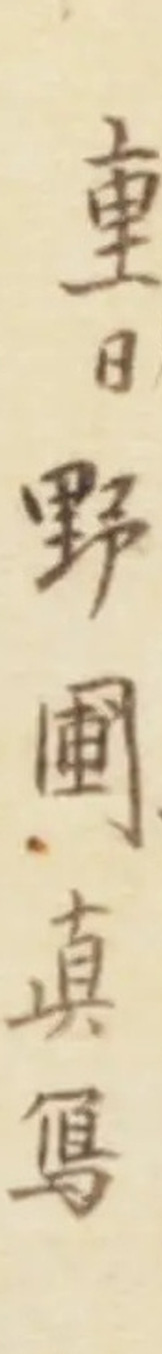重日野圃真写
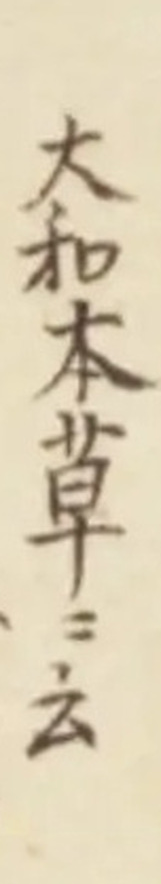大和本草云
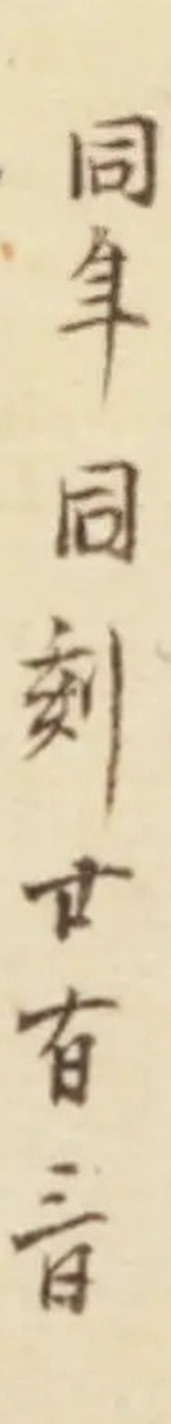同年同刻廿有三日
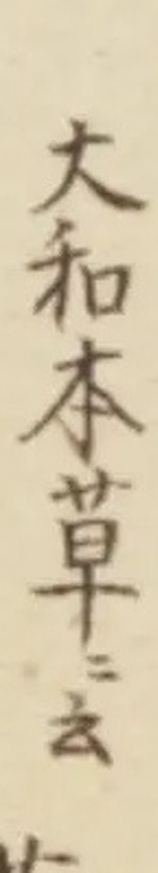大和本草云
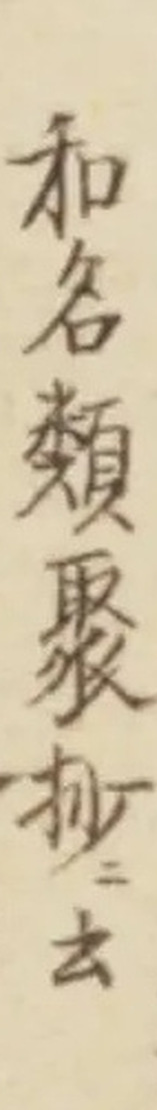和名類聚抄云
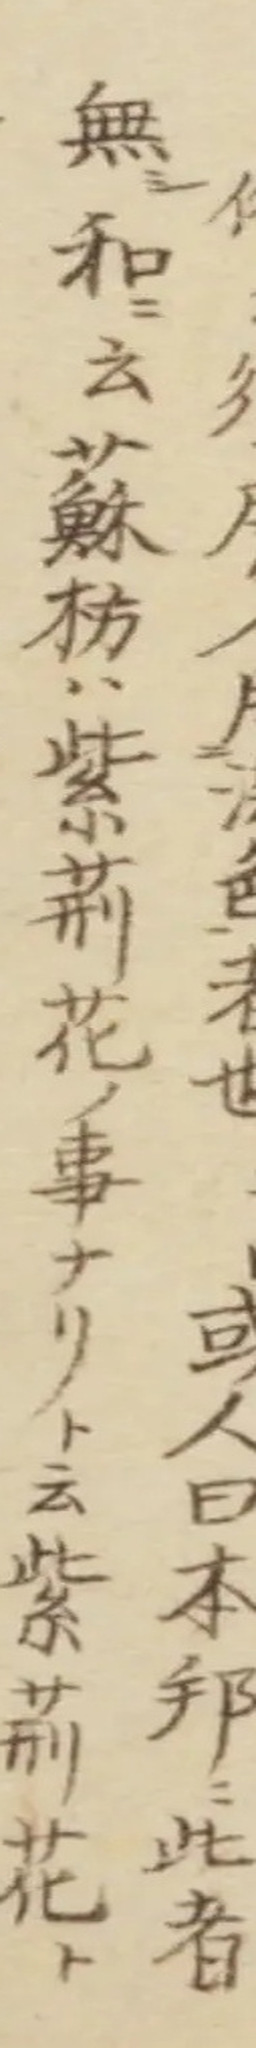無和云蘇枋ハ紫荊花ノ事ナリト云紫荊花ト
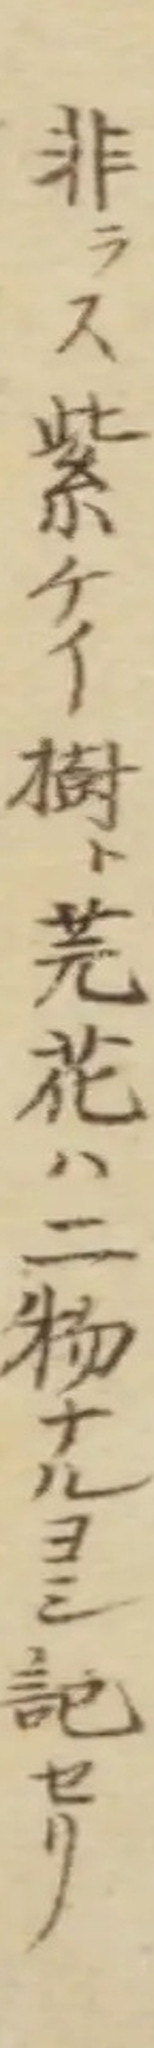非ス紫ケイ樹ト芫花ハ二物ナルヨシ記セリ

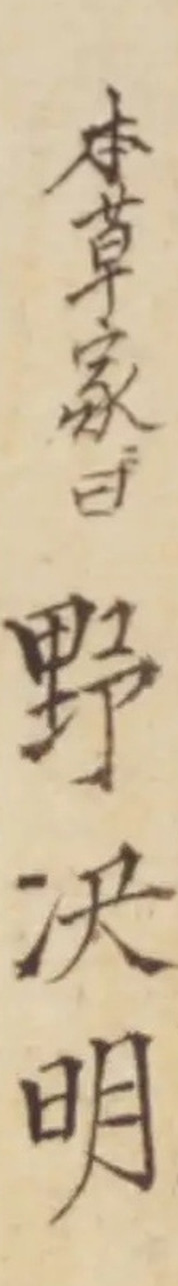本草家曰野决明
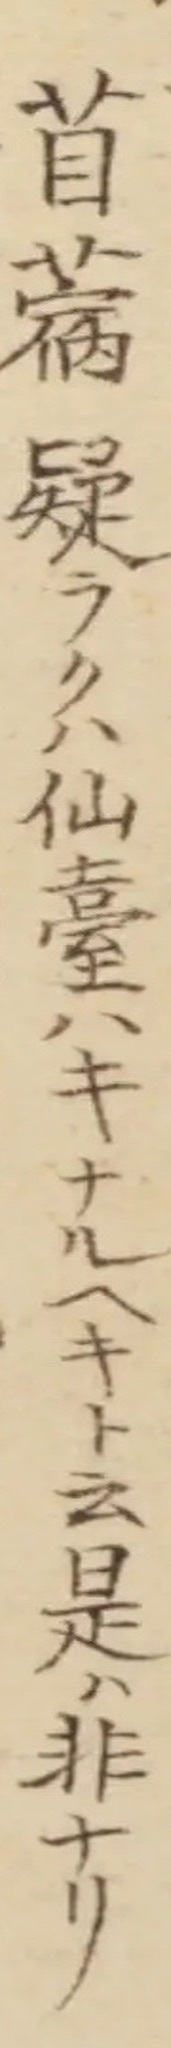苜蓿疑ラクハ仙臺ハキナルヘキト云是ハ非ナリ
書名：梅園草木花譜春之部. 1
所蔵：国立国会図書館 National Diet Library, JAPAN
